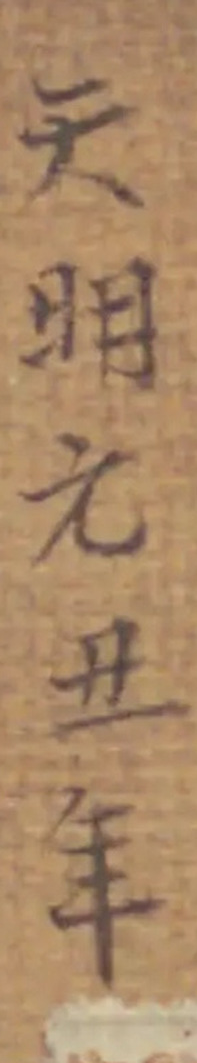天明元丑年

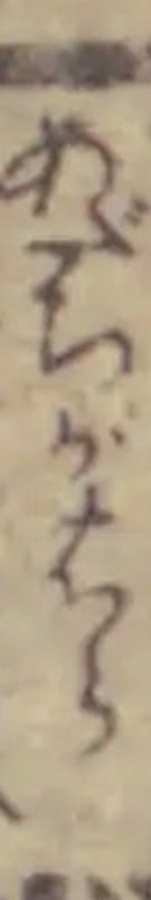あだちがはら
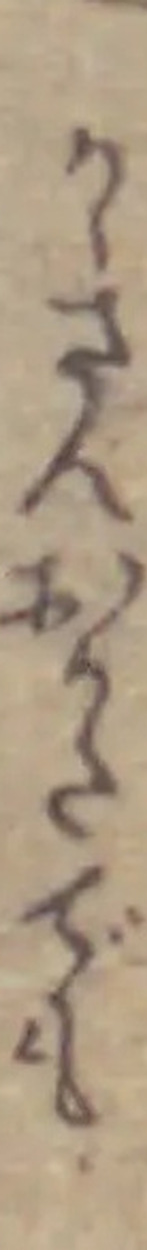かゝさんおかたでも
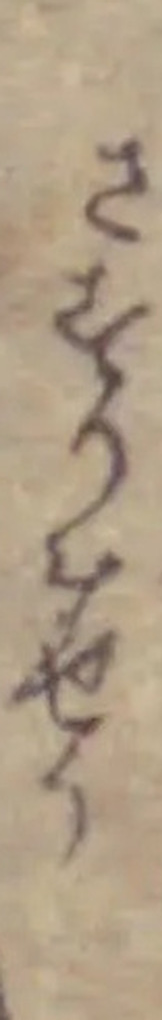さすりませう
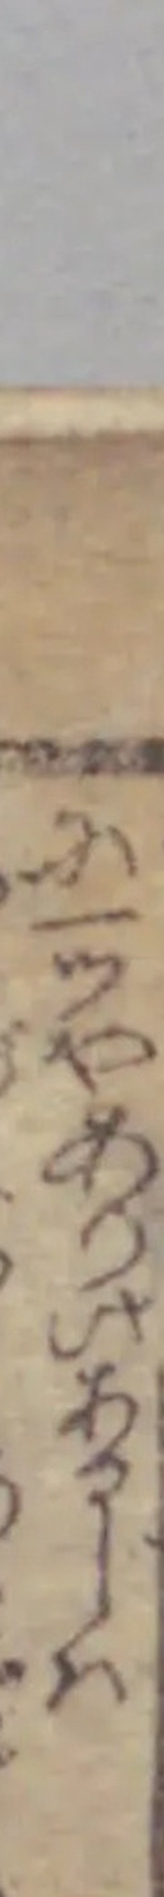に一つやあり此あるしは
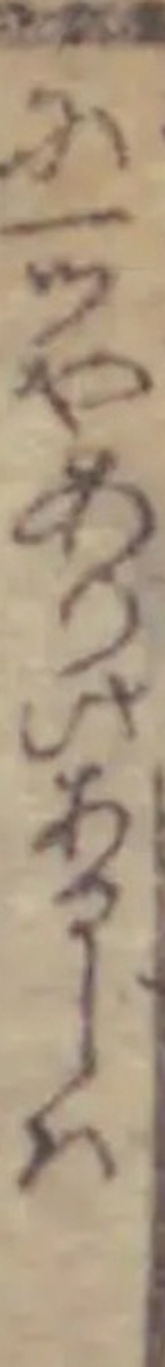に一つやあり此あるしは
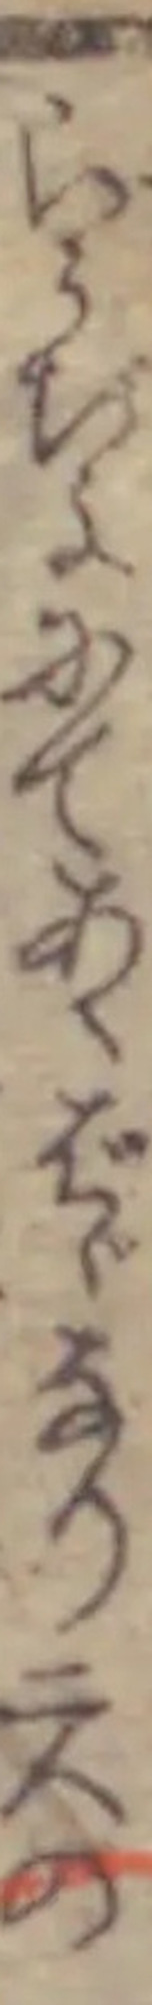らうぢよににてあくばゞなり二人
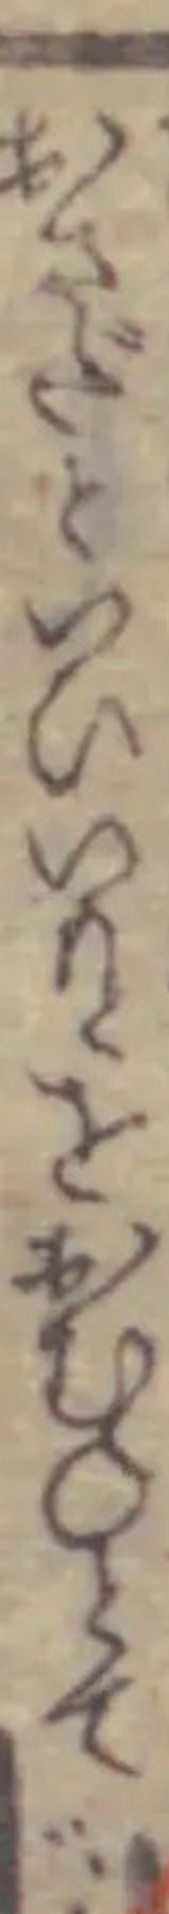おさだといひいもとをおむねとて
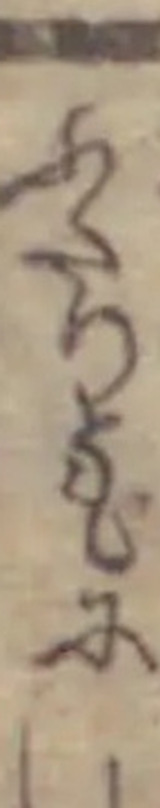ふたりとも
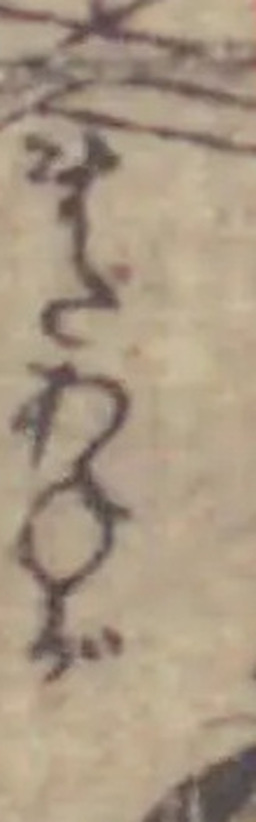またあねが
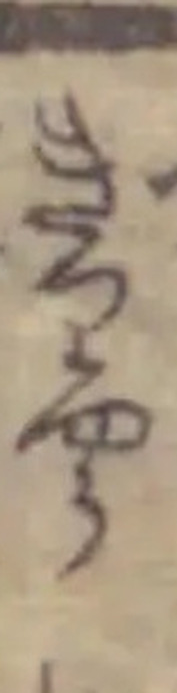きりやう
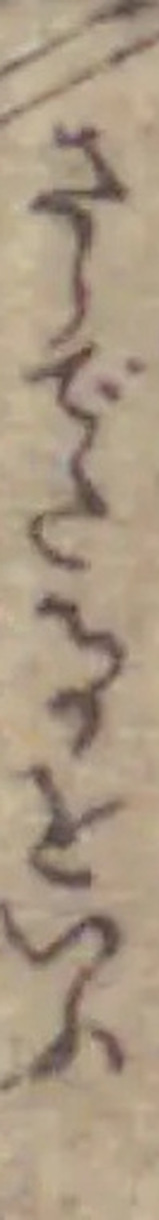さしでた事をいふ
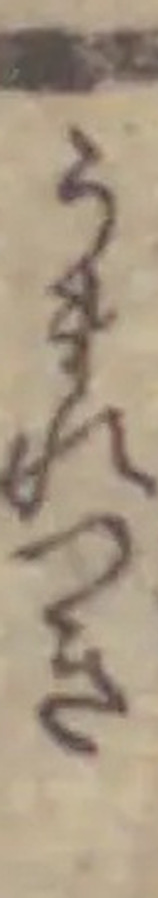うまれつき
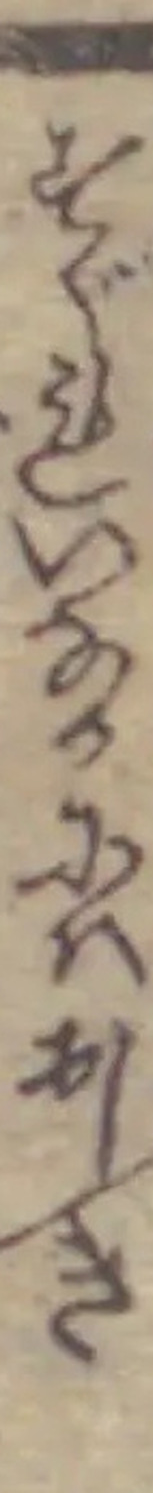すぐれいなかにはおしき
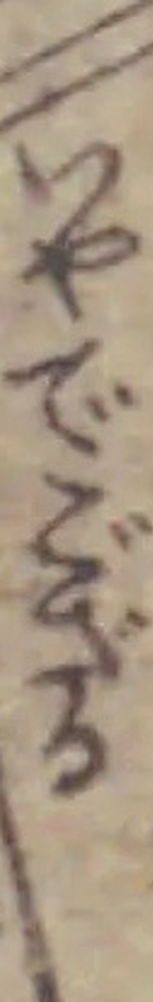いやでござる
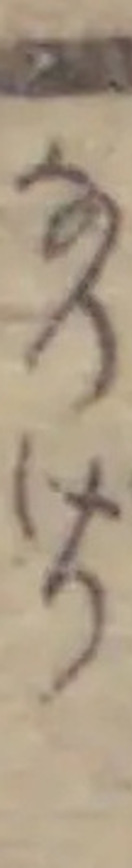なりけり
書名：奥州咄 3巻
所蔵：国立国会図書館 National Diet Library, JAPAN
